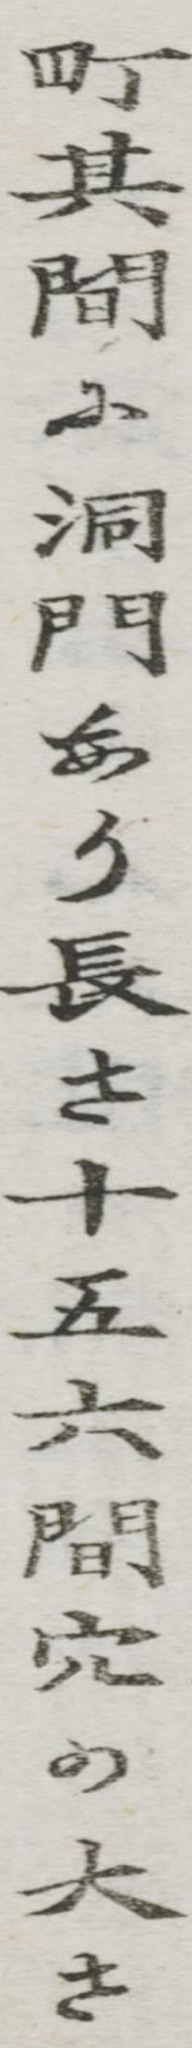町其間に洞門あり長さ十五六間穴の大さ
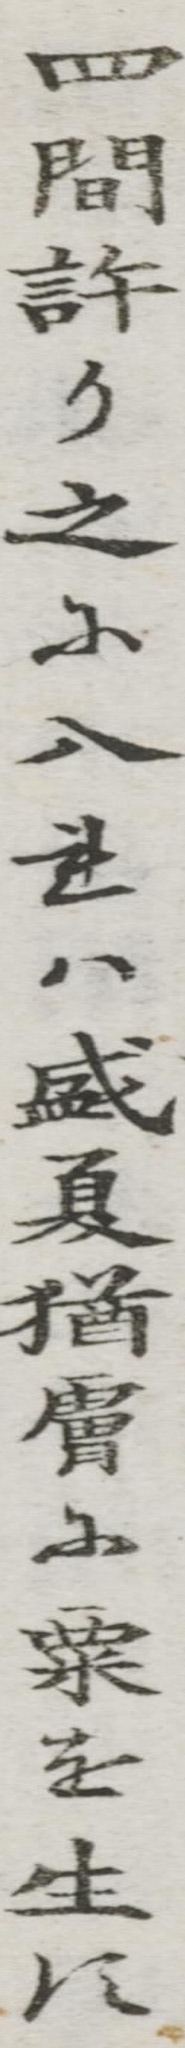四間許り之に入れは盛夏猶膚に粟を生す
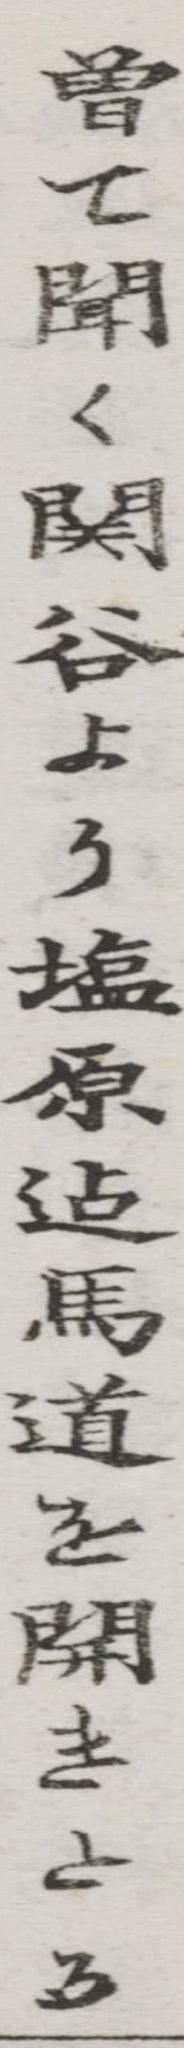曽て聞く関谷より塩原迄馬道を開きたる
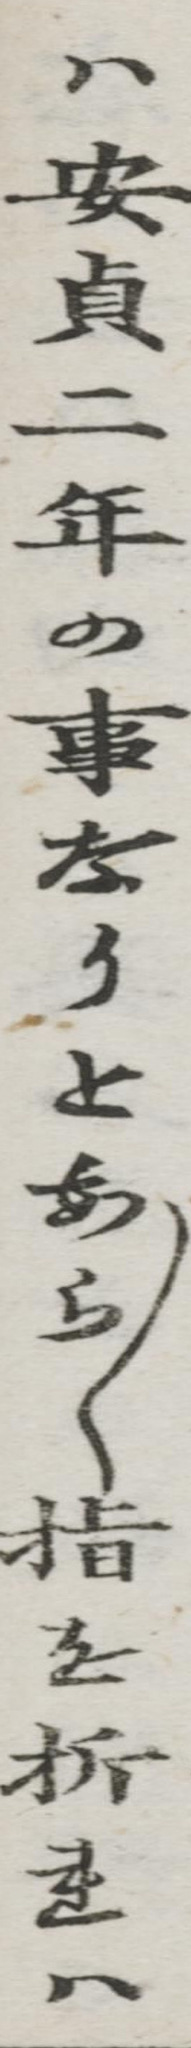は安貞二年の事なりとあら〳〵指を折れは
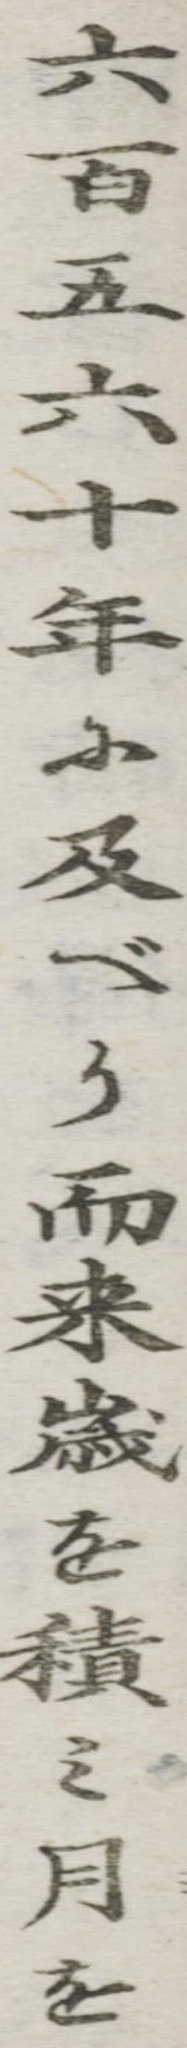六百五六十年に及べり而来歳を積み月を
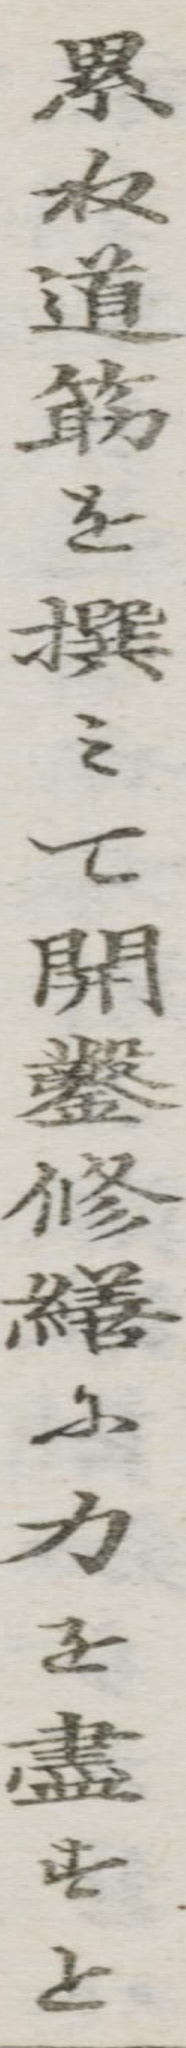累ね道筋を撰みて開鑿修繕に力を尽すと
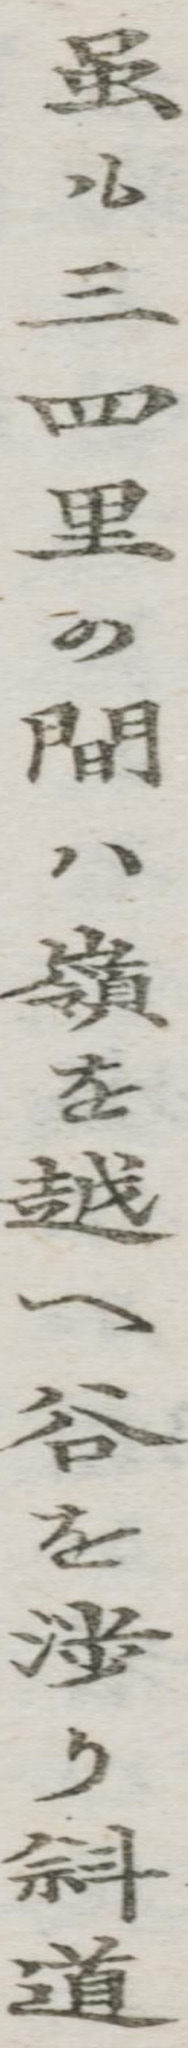雖も三四里の間は嶺を越へ谷を渉り斜道
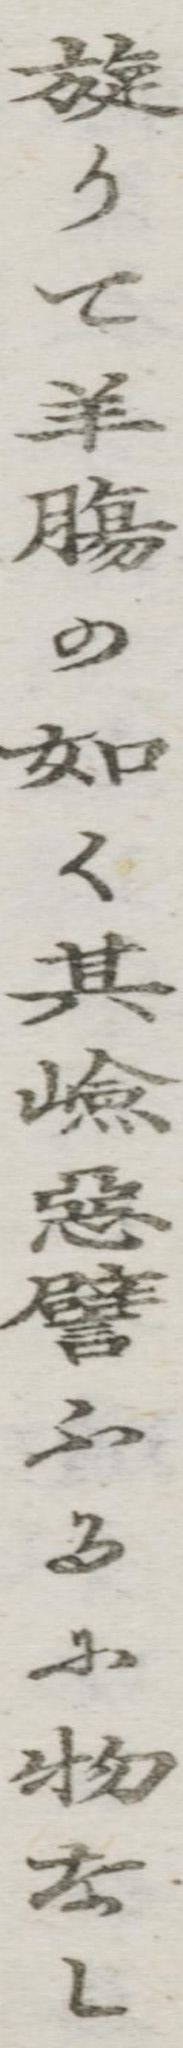旋りて羊腸の如く其嶮悪譬ふるに物なし
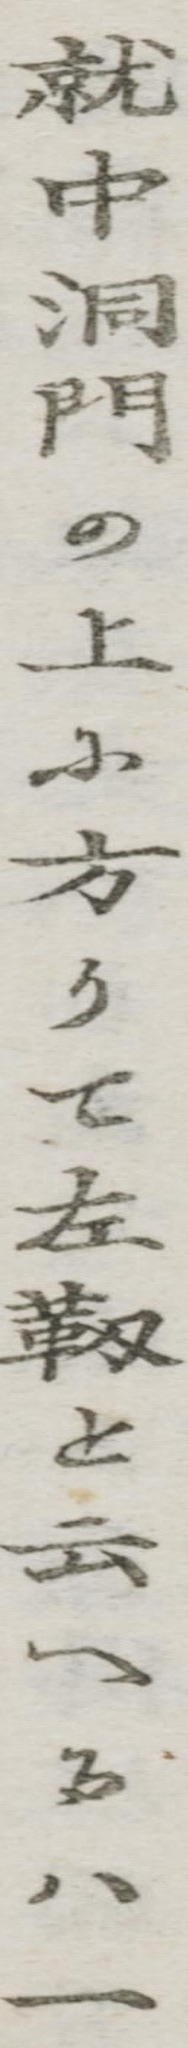就中洞門の上に方りて左靭と云へるは一
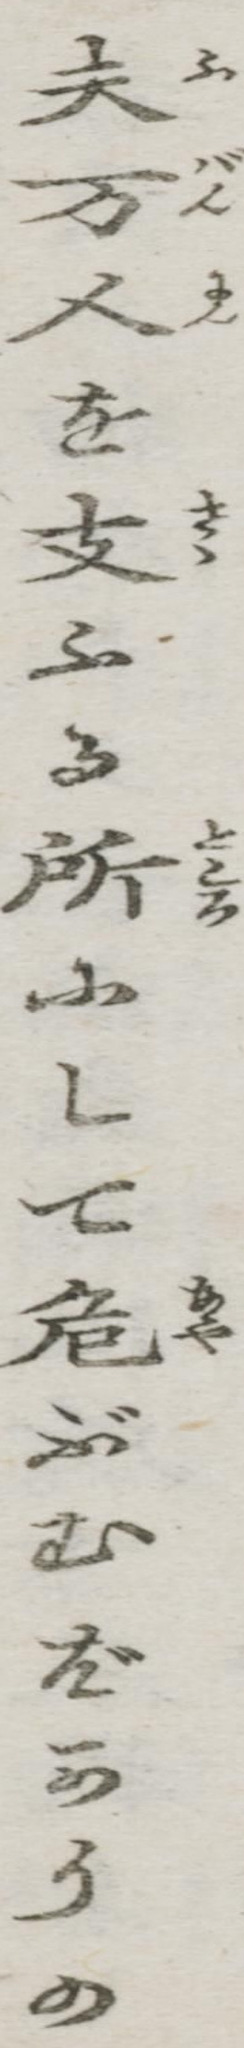夫万人を支ふる所にして危ぶむばかりの
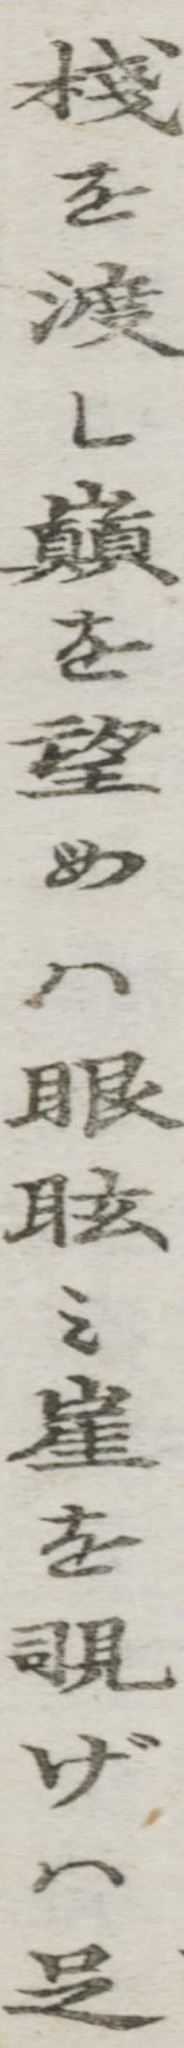桟を渡し巓を望めは眼眩み崖を覗げは足
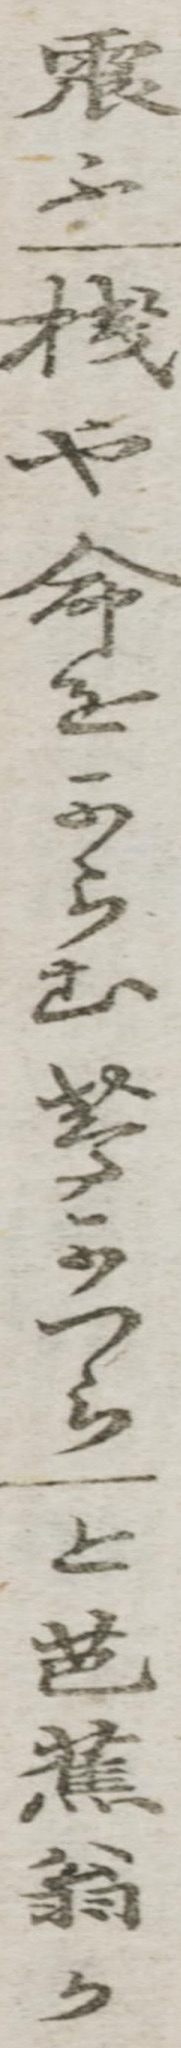震ふ「桟や命をからむ蔦かつら」と芭蕉翁か

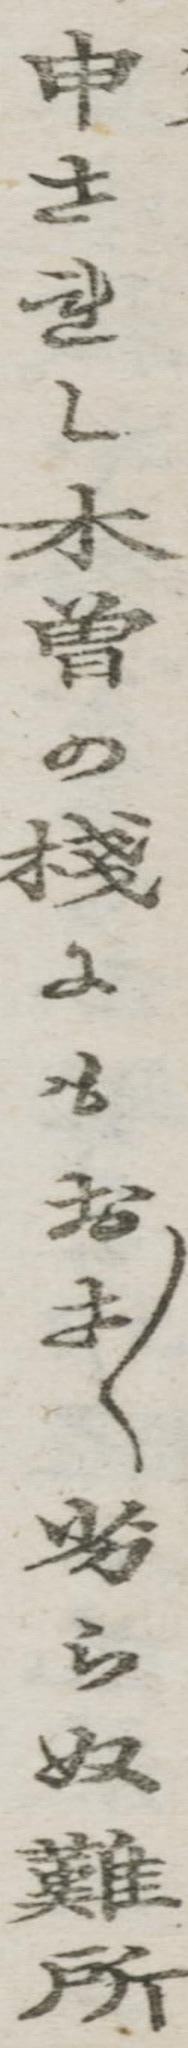申されし木曽の桟にもおさ〳〵劣らぬ難所
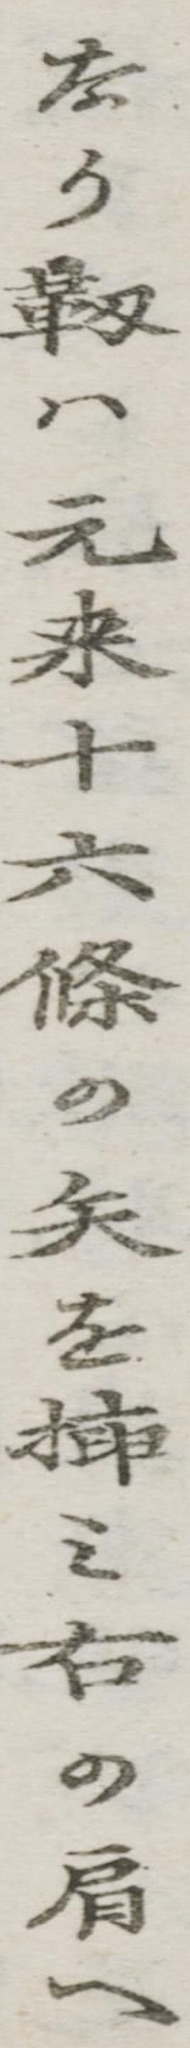なり靭は元来十六条の矢を挿み右の肩へ
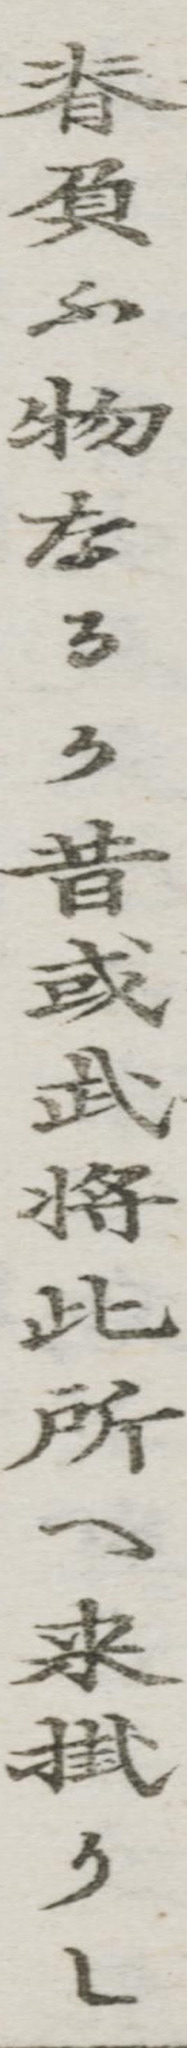背負ふ物なるか昔或武将此所へ来掛りし
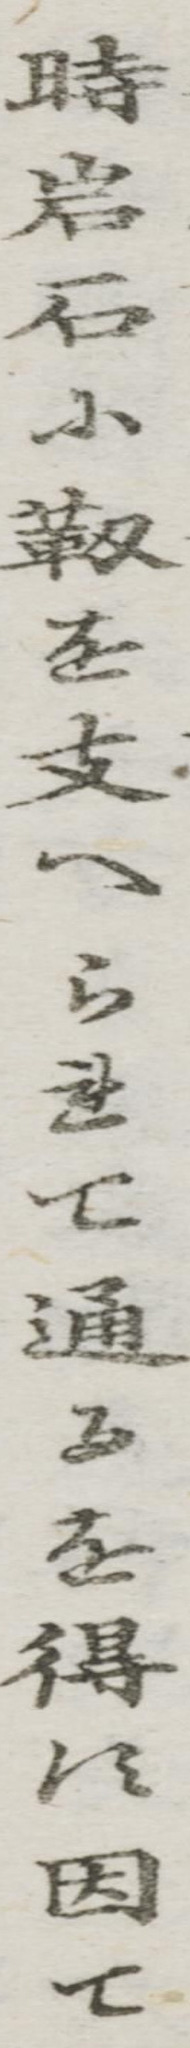時岩石に靭を支へられて通るを得す因て
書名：塩原繁昌記　全
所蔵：東京大学地震研究所図書室 Earthquake Research Institute Library, The University of Tokyo, JAPAN
